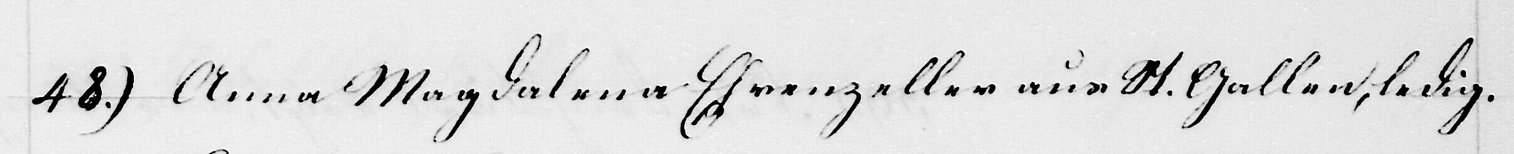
48.) Anna Magdalena Ehrenzeller aus St. Gallen, ledig.
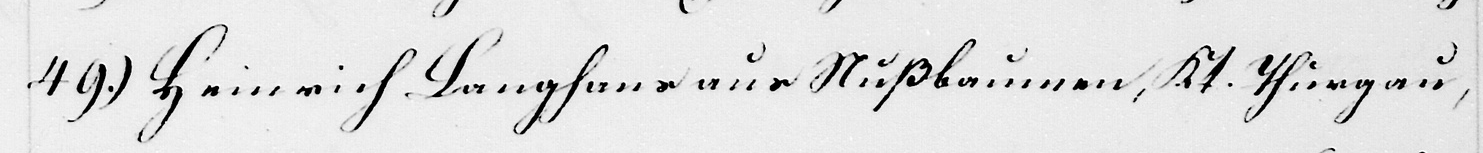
49.) Heinrich Langhans aus Nußbaumen, Kt. Thurgau,
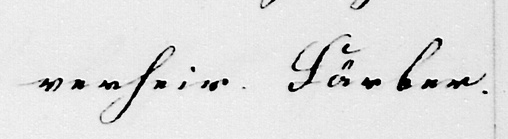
verheir. Färber.
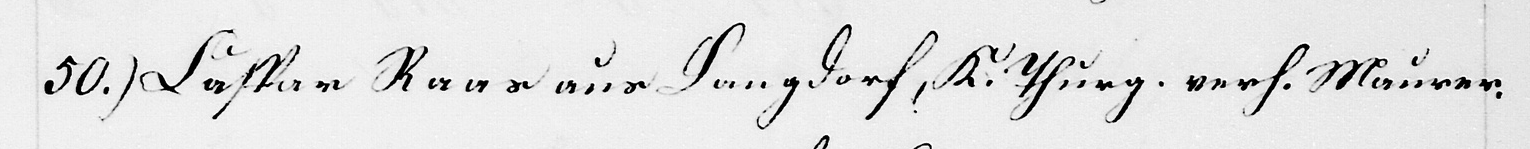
50.) Caspar Raas aus Langdorf, K. Thurg. verh. Maurer.
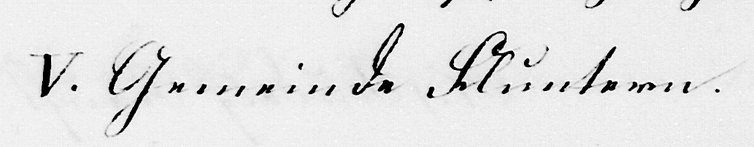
V. Gemeinde Fluntern.
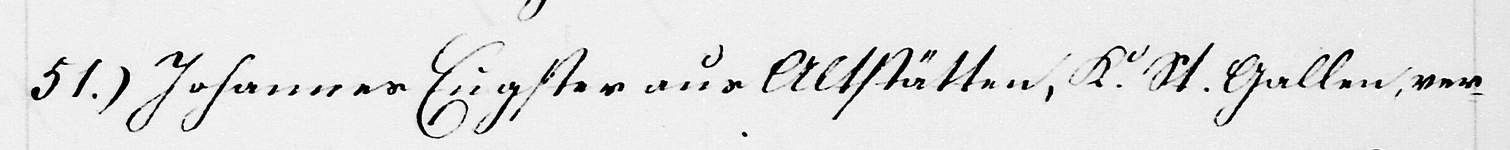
51.) Johannes Eugster aus Altstätten, K. St. Gallen, ver¬
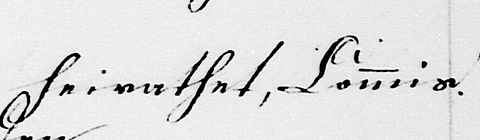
heirathet, Commis.
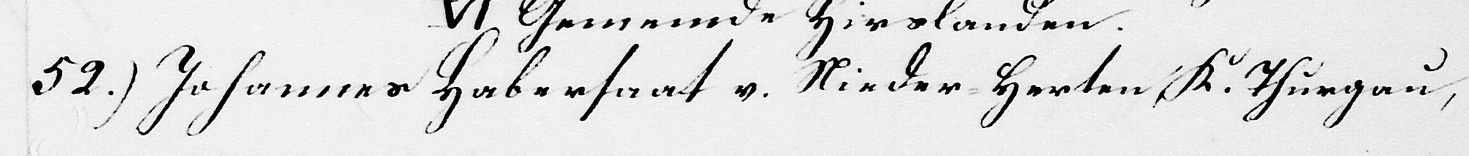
52.) Johannes Habersaat v. Nieder-Herten, K. Thurgau,
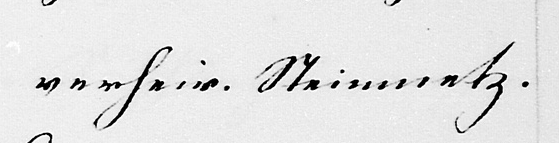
verheir. Steinmetz.
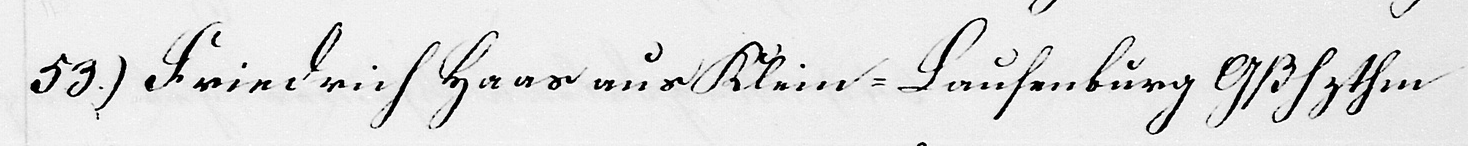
53.) Friedrich Haas aus Klein-Laufenburg Gßhzthm
